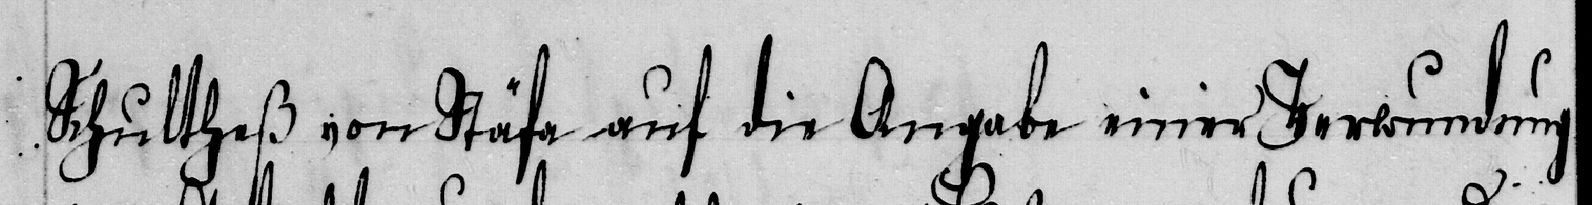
Schultheß von Stäfa auf die Angabe einer Verwundung
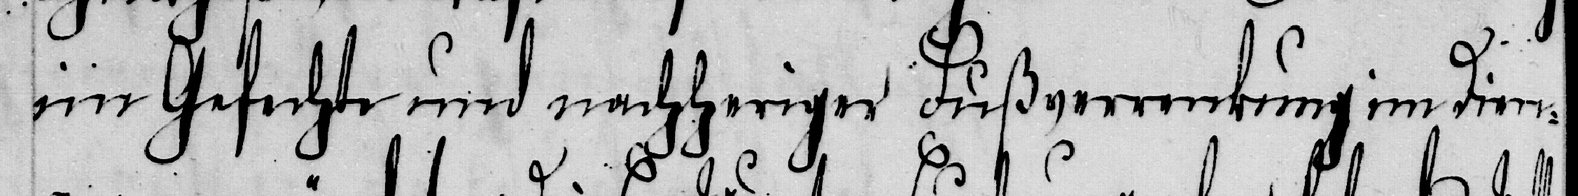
im Gefechte und nachheriger Fußverrenkung im Dien¬
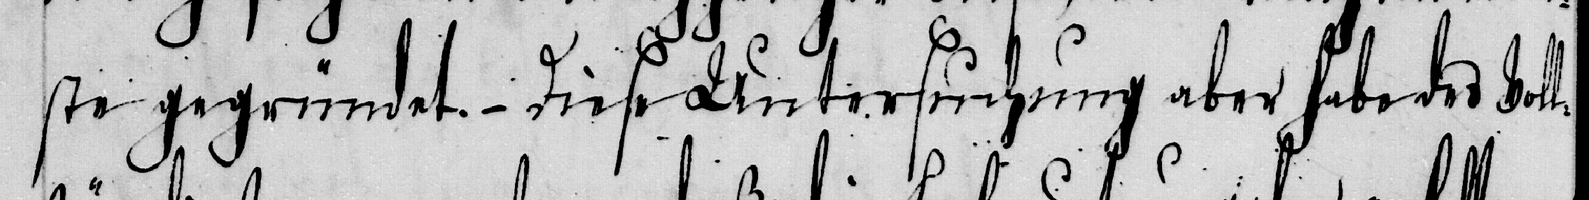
ste gegründet. – Diese Untersuchung aber habe des Vol¬
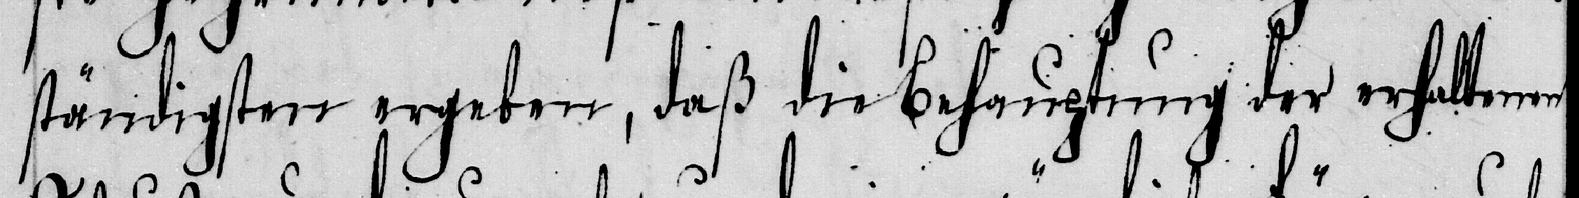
ständigsten ergeben, daß die Behauptung der erhaltenen
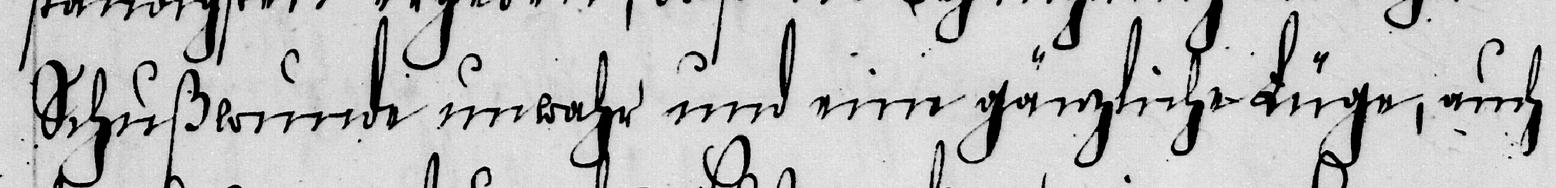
Schußwunde unwahr und eine gänzliche Lüge, auch
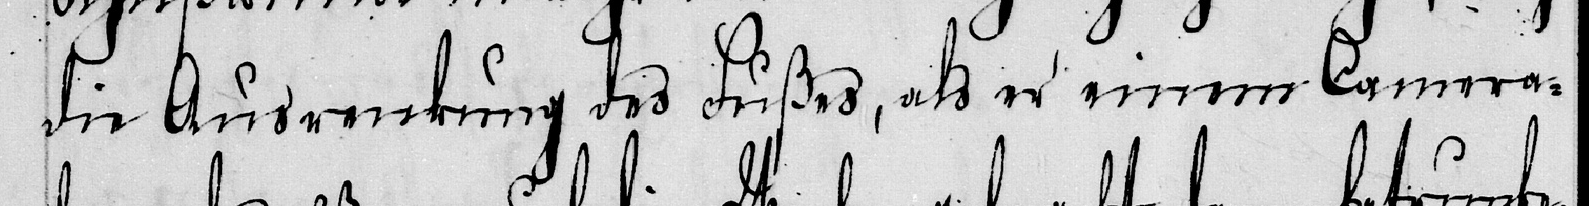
die Ausrenkung des Fußes, als er einem Camera¬
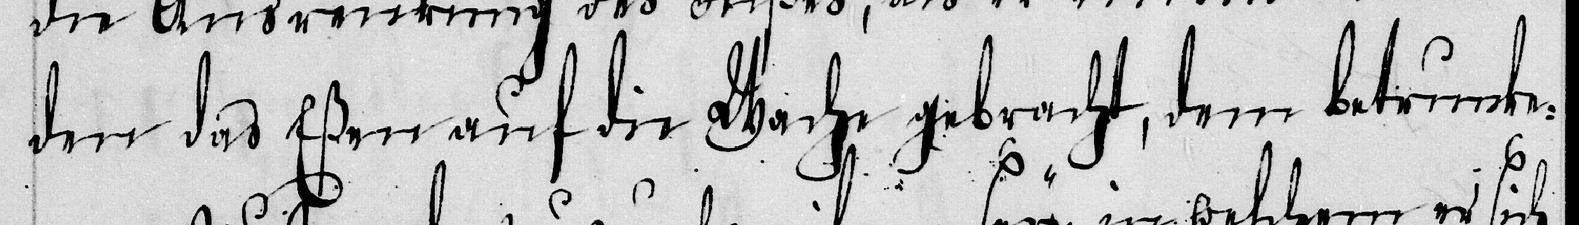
den das Eßen auf die Wache gebracht, dem betrunke¬
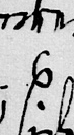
die
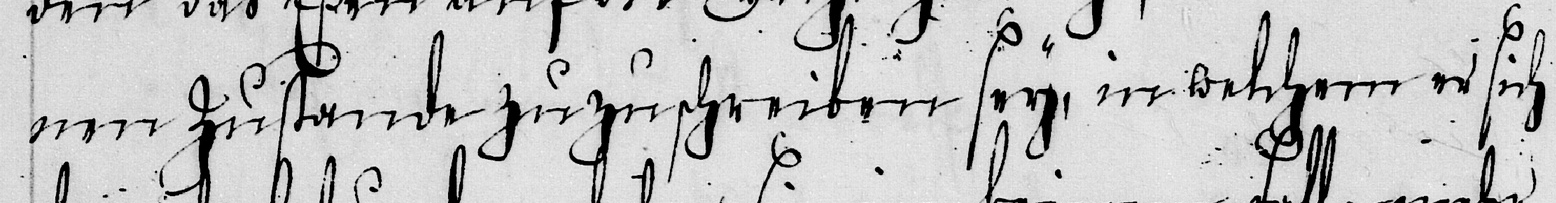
nen Zustande zuzuschreiben sey, in welchem er sich
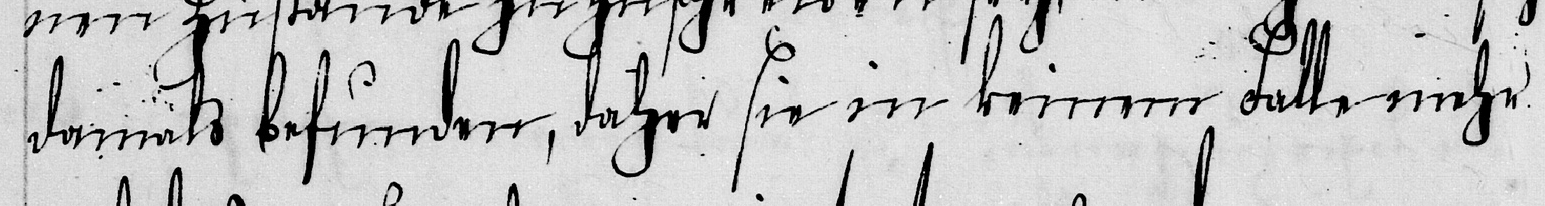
damals befunden, daher sie in keinem Falle mehr
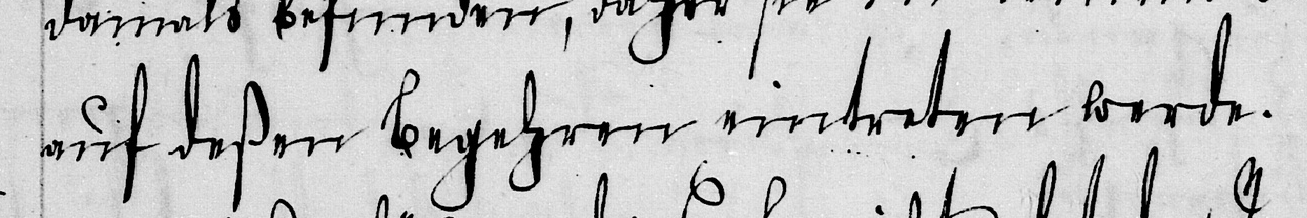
auf deßen Begehren eintreten werde.
